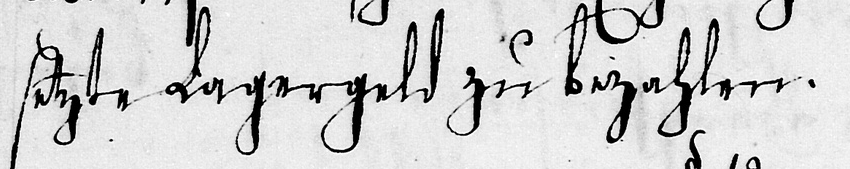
setzte Lagergeld zu bezahlen.
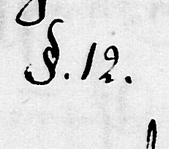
§. 12.
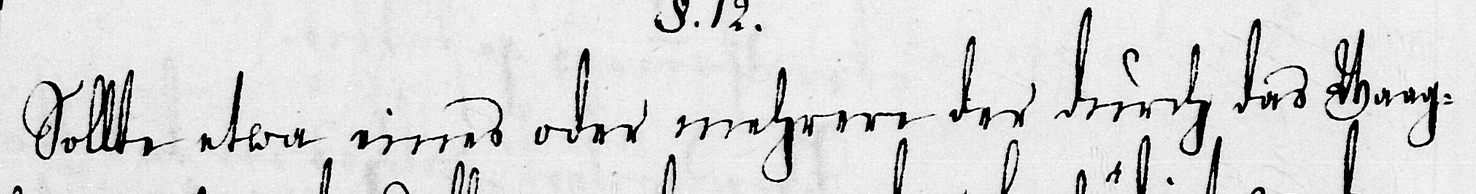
Sollte etwa eines oder mehrere der durch das Waag¬
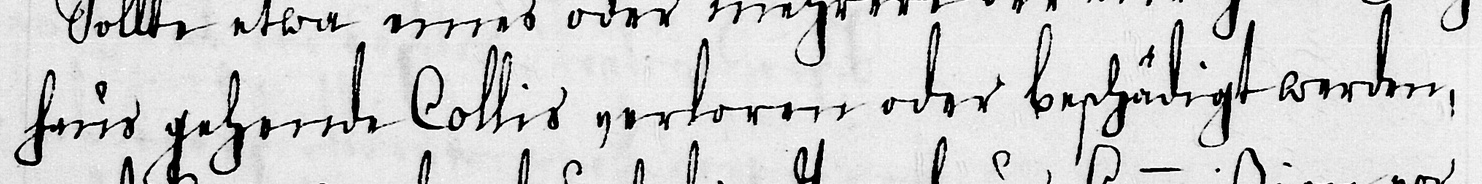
haus gehende Collis verloren oder beschädigt werden,
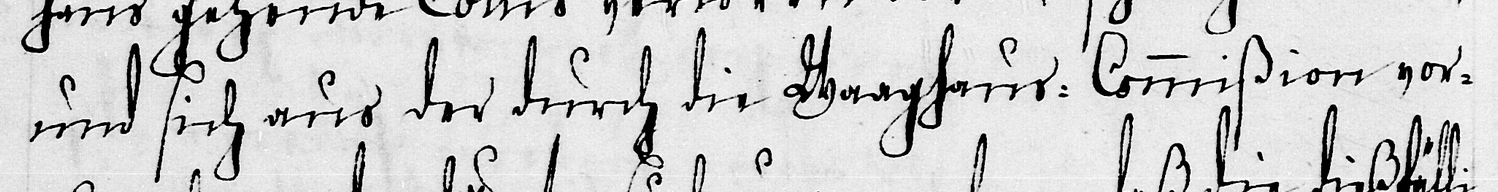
und sich aus der durch die Waaghaus-Commißion vor¬
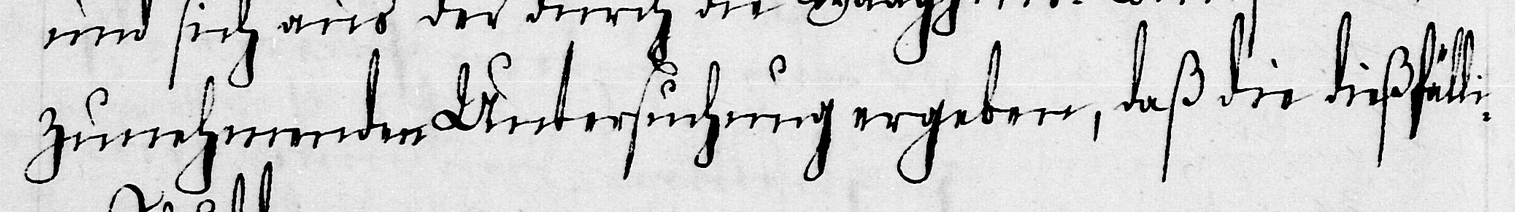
zunehmenden Untersuchung ergeben, daß die dießfäl¬
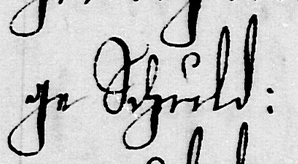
ge Schuld:
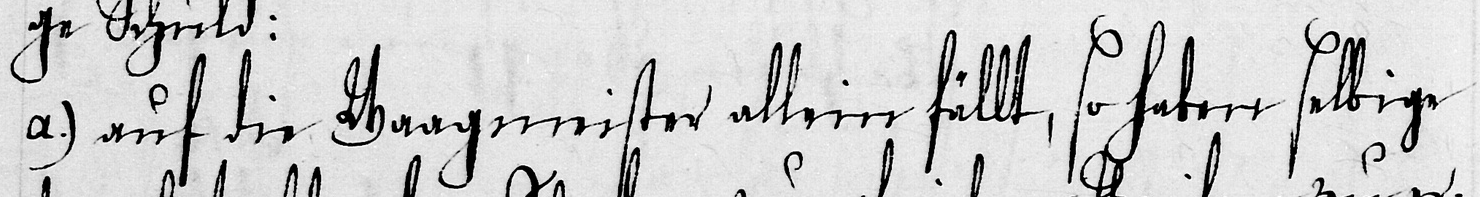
b.) Auf die Spanner allein fällt, so haben diese
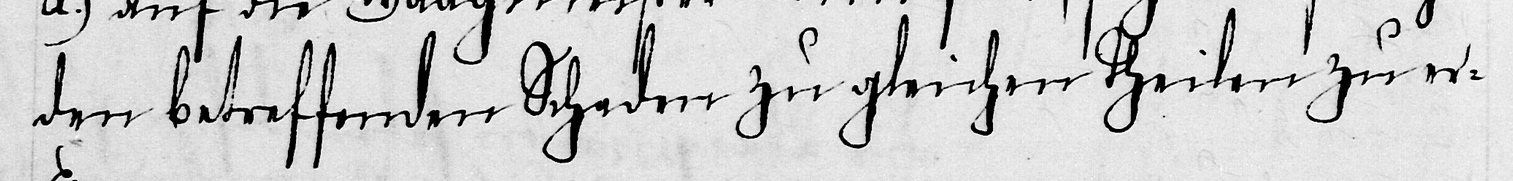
den betreffenden Schaden zu gleichen Theilen zu er¬
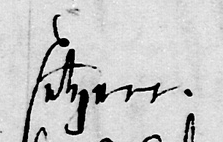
setzen.
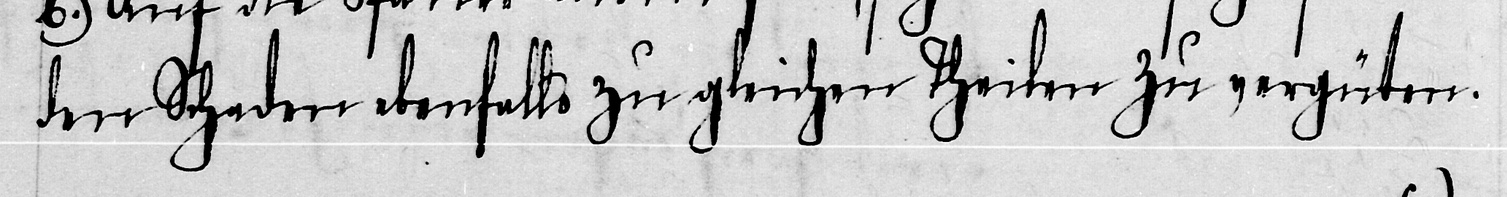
den Schaden ebenfalls zu gleichen Theilen zu vergüten.
